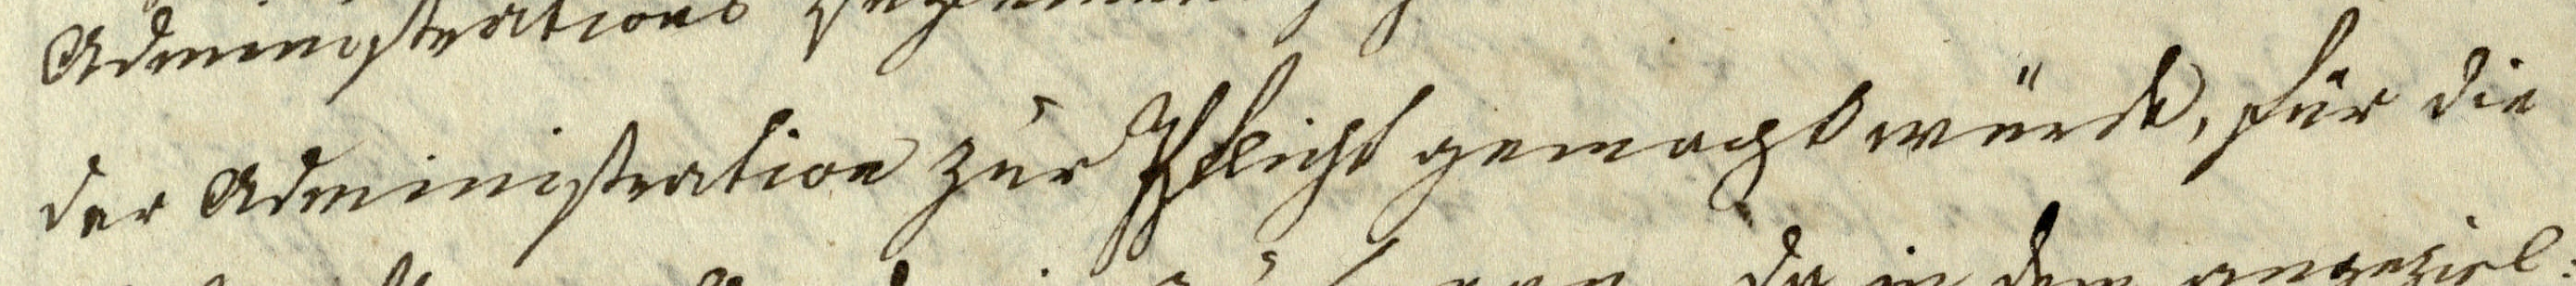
der Administration zur Pflicht gemacht würde, für die
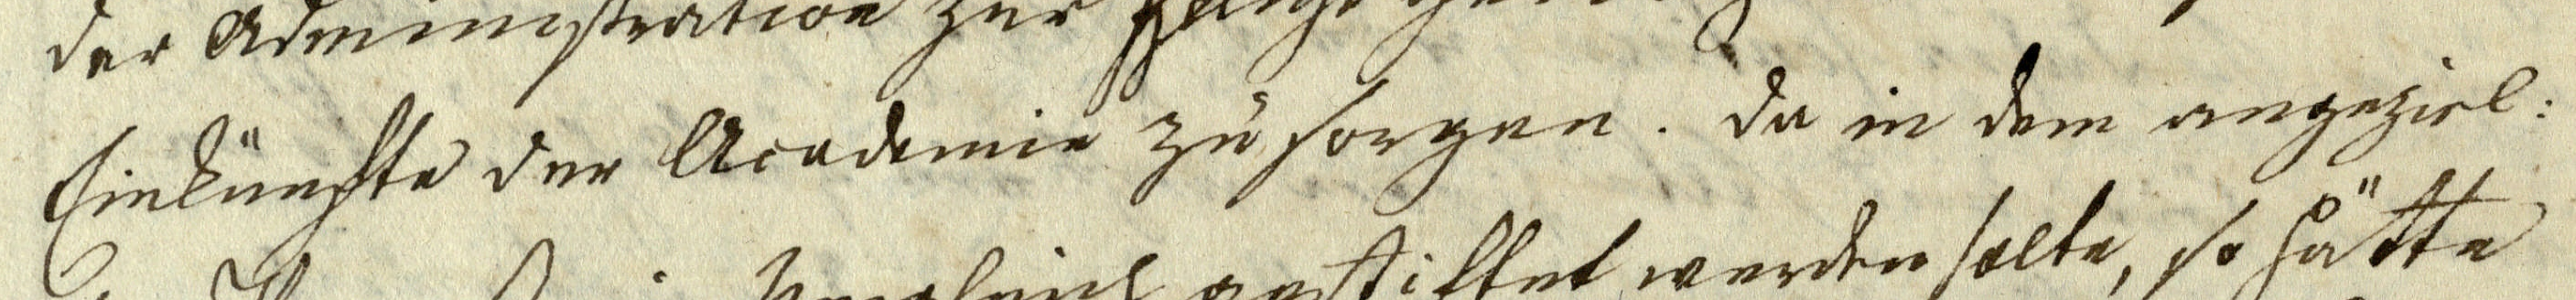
Einkünfte der Academie zu sorgen. Da in dem angeziel¬
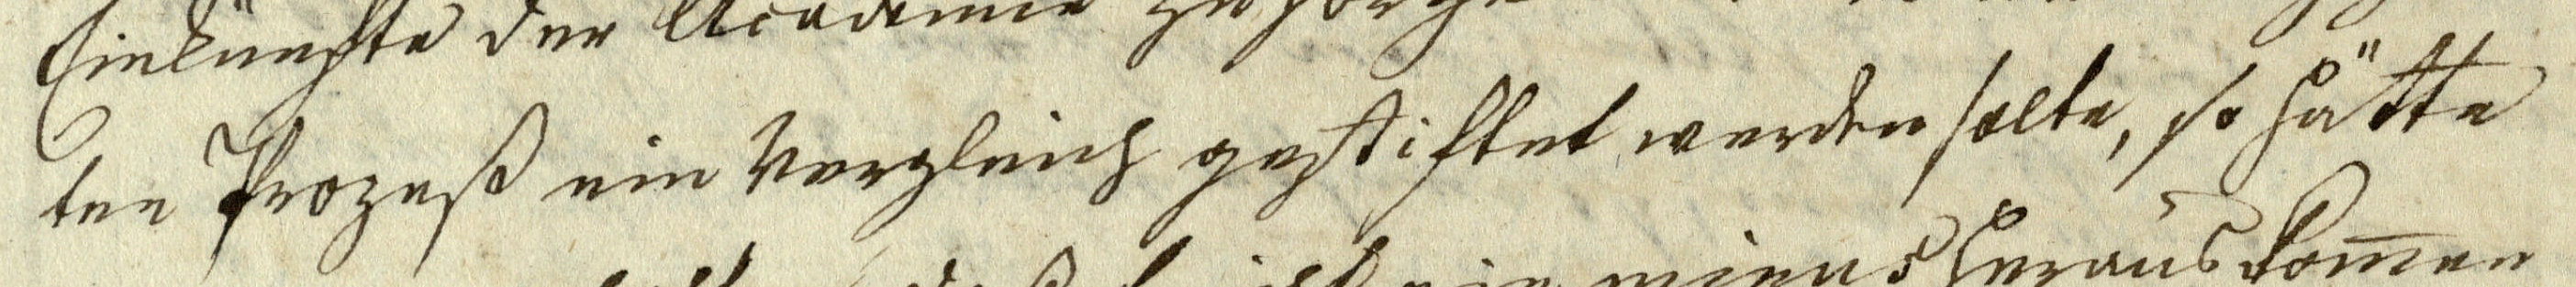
ten Prozeß ein Vergleich gestiftet werden solte, so hätte
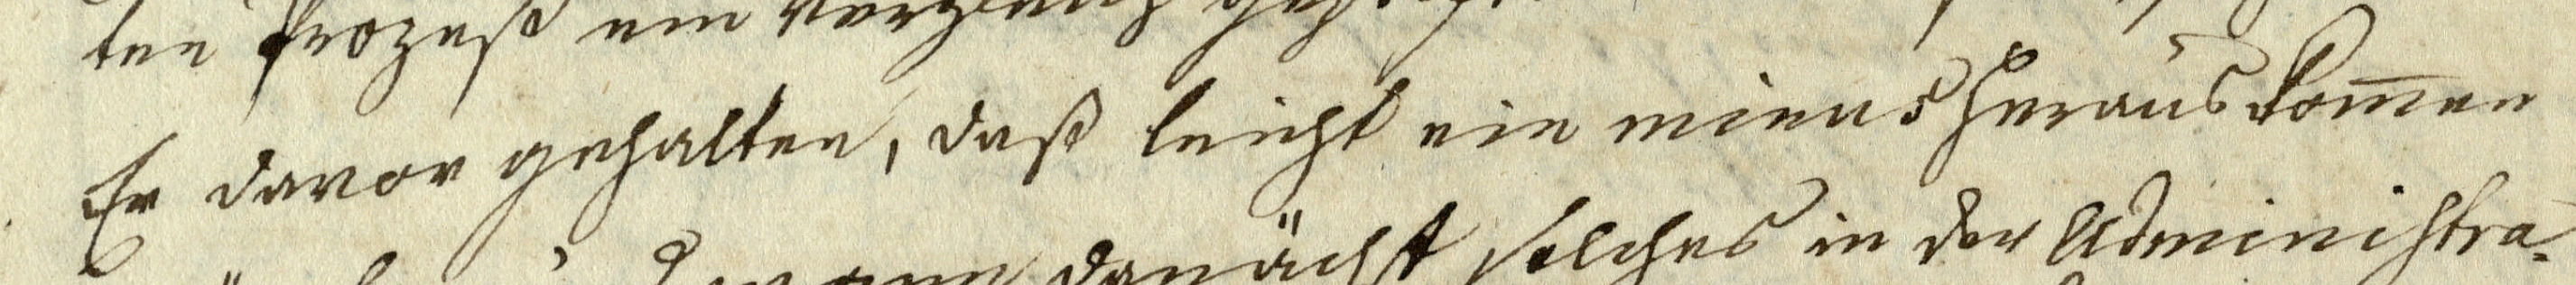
Er davor gehalten, daß leicht ein minus heraus komen
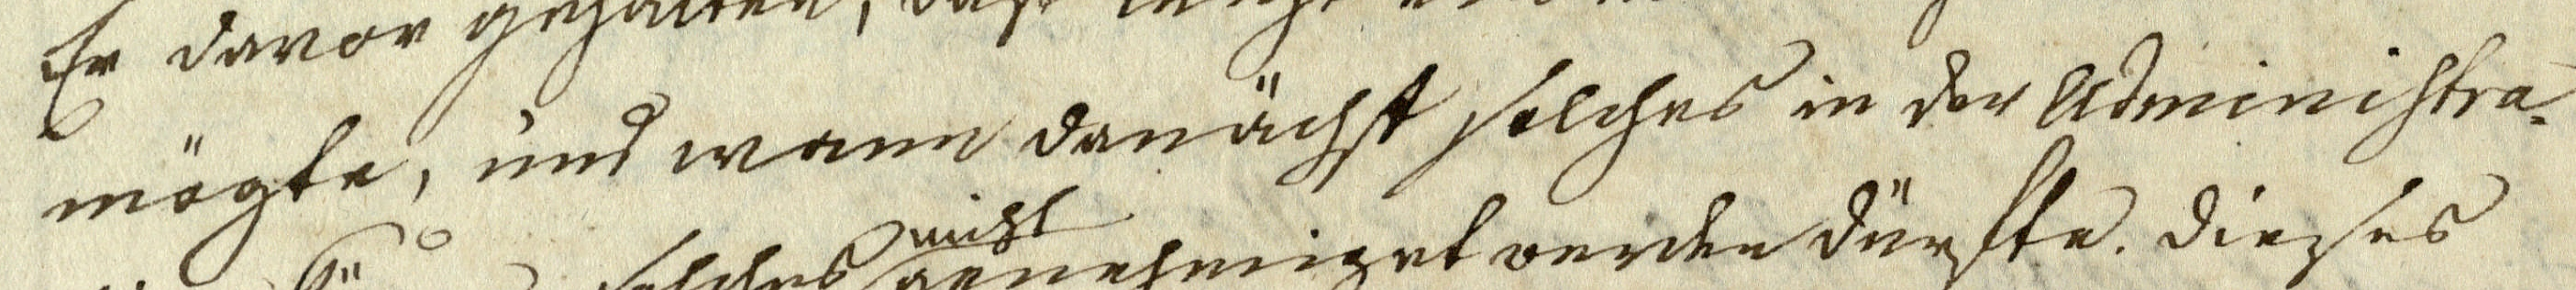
mögte, und wann danächst solches in der Administra¬
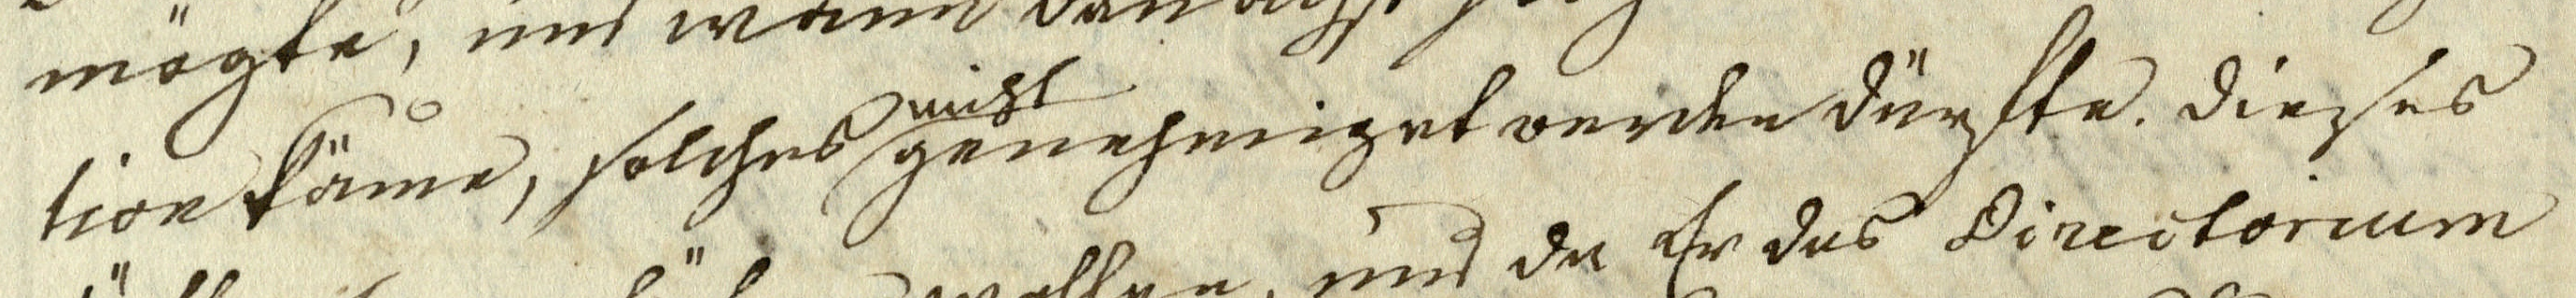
tion käme, solches nicht genehmiget werden dürfte. Dieses
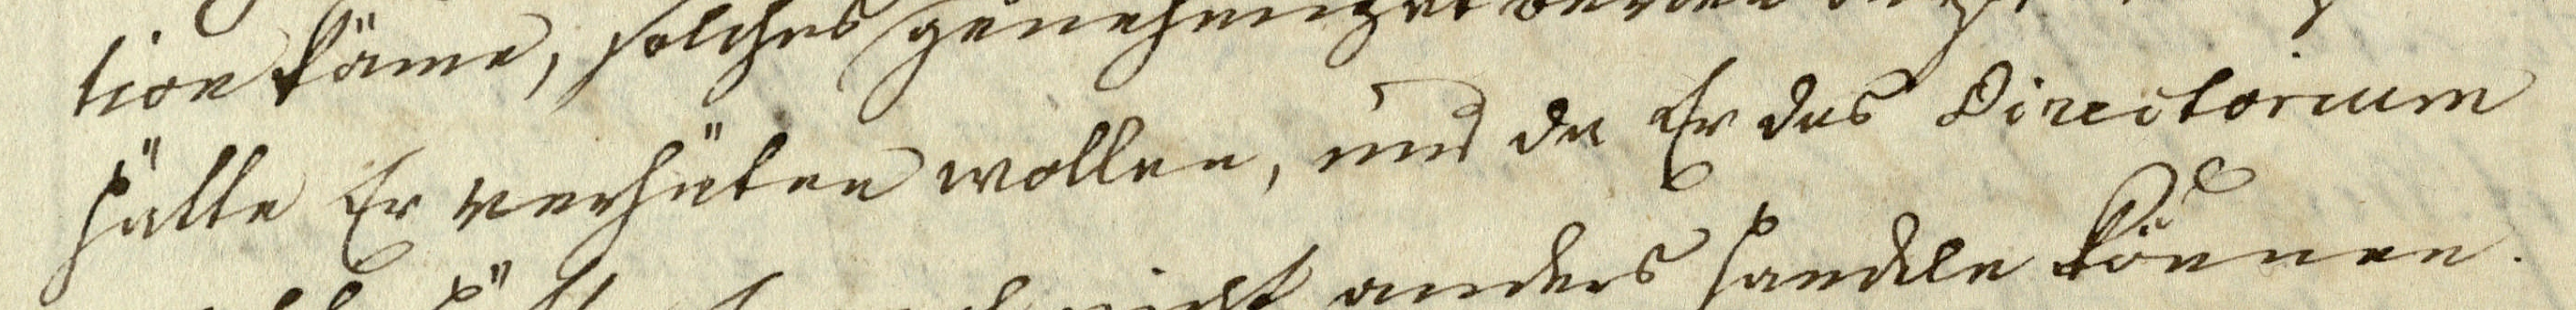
hätte Er verhüten wollen, und da Er das Directorium
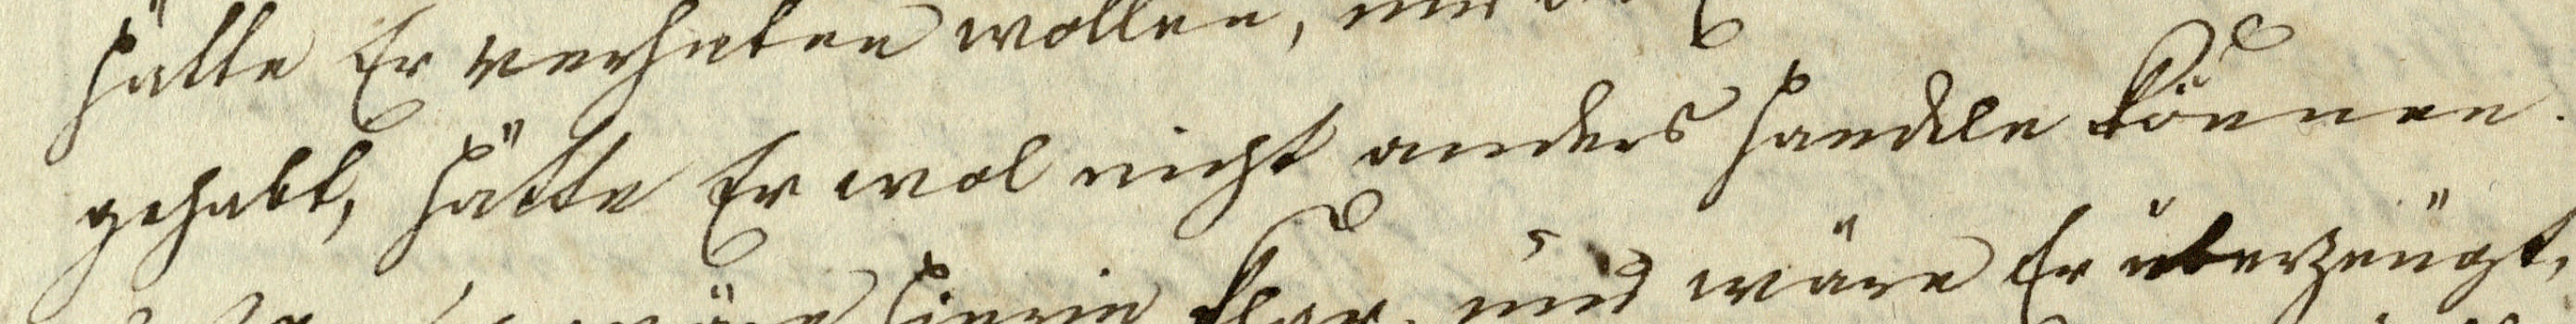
gehabt, hätte Er wol nicht anders handeln können.
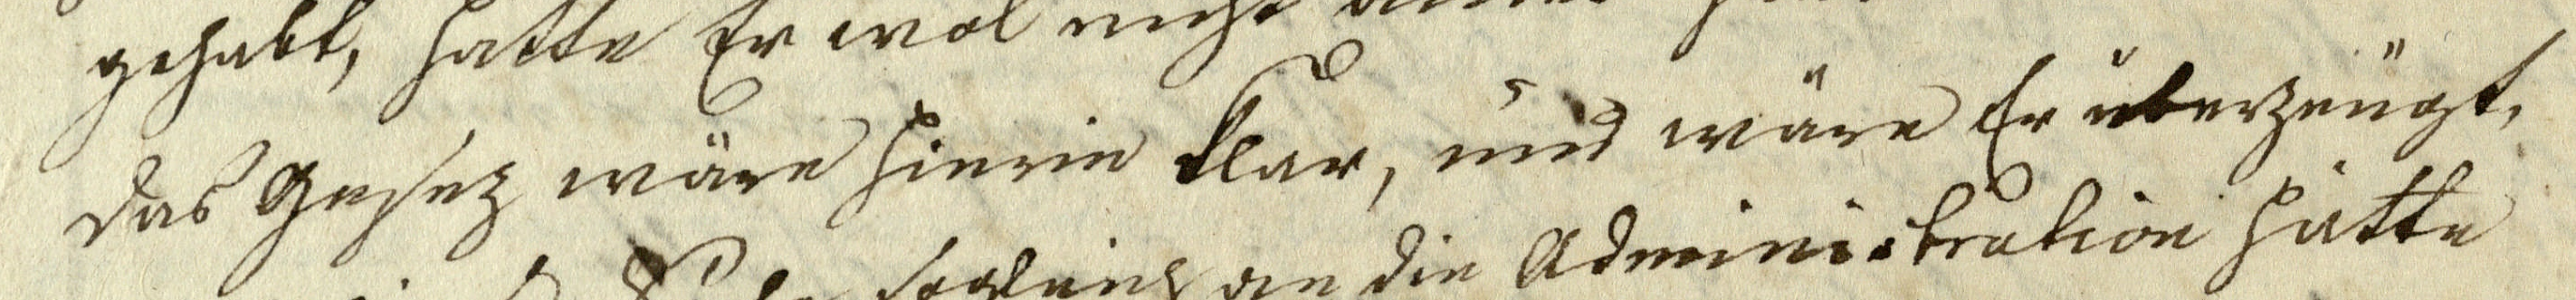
Das Gesez wäre hierin klar, und wäre Er überzeugt,
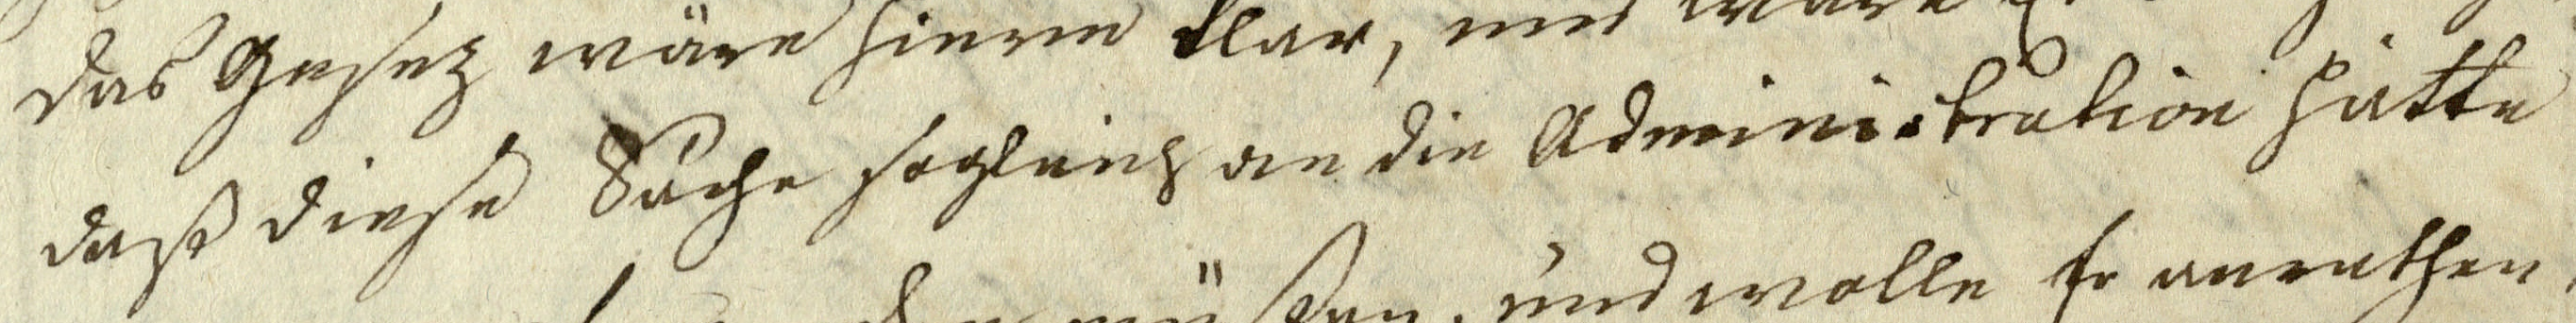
daß dies Sache sogleich an die Administration hätte
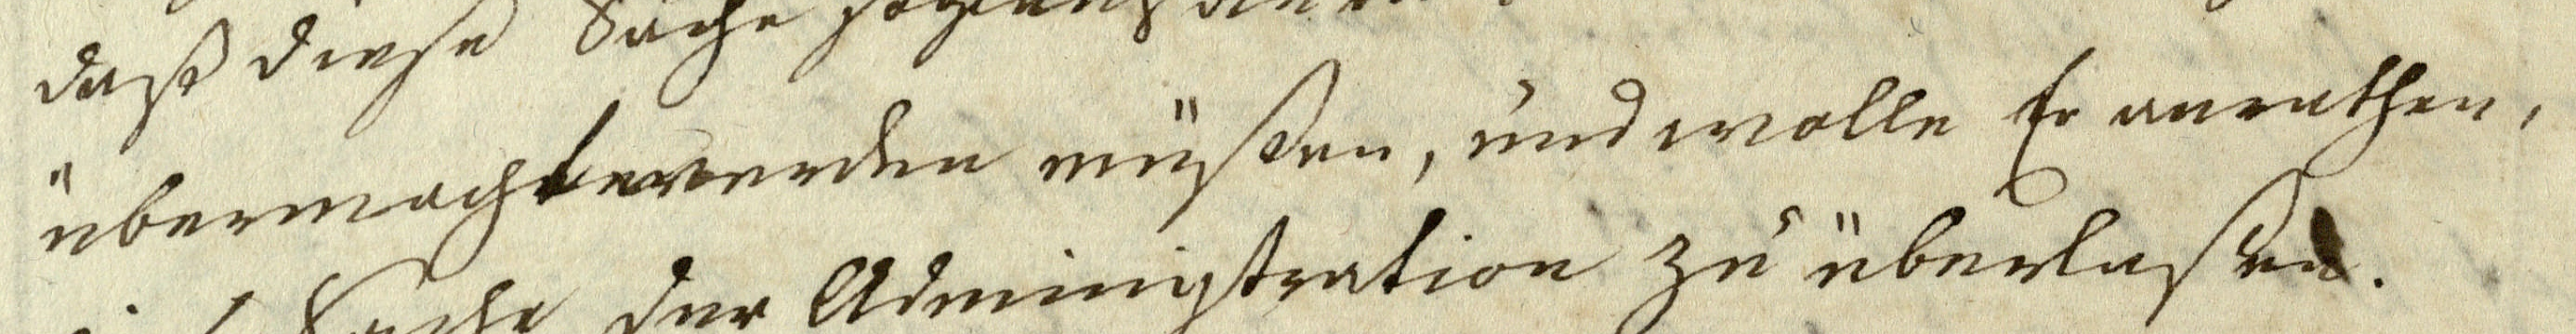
übermacht werden müßen, und wolle Er anrathen,
